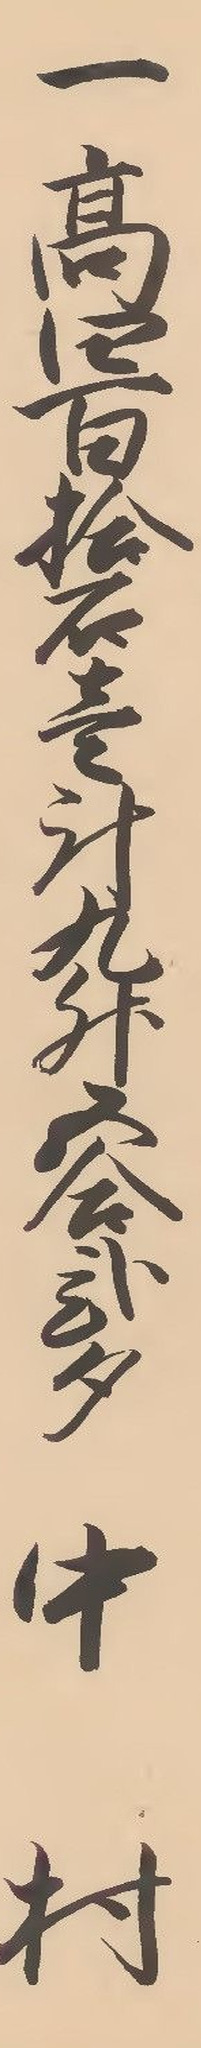一高四百拾石壱斗九升五合弐勺中村
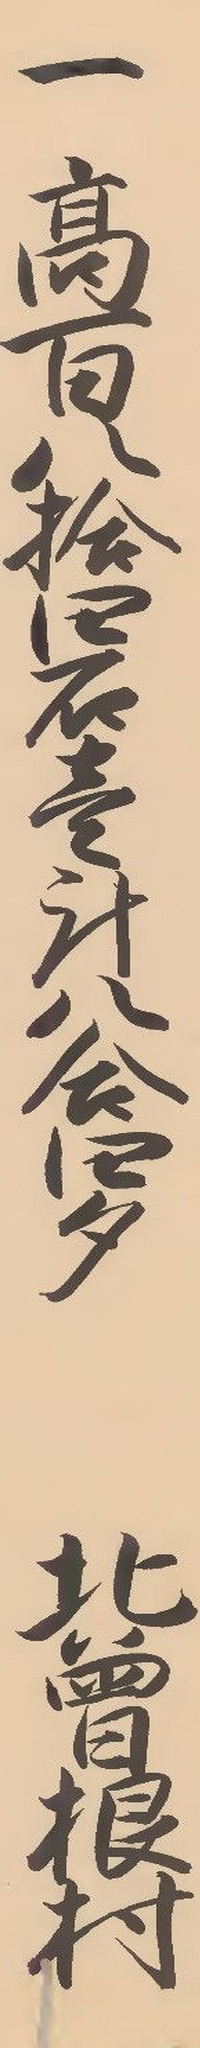一高百八拾四石壱斗八合四勺北曽根村
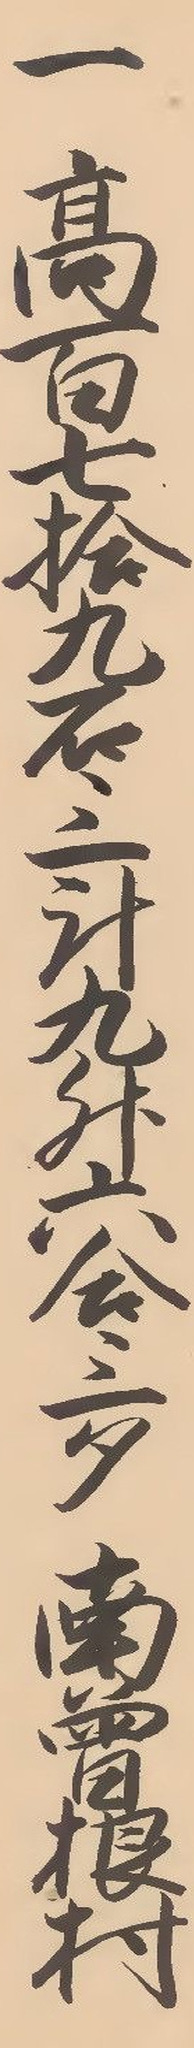一高百七拾九石三斗九升六合三勺南曽根村
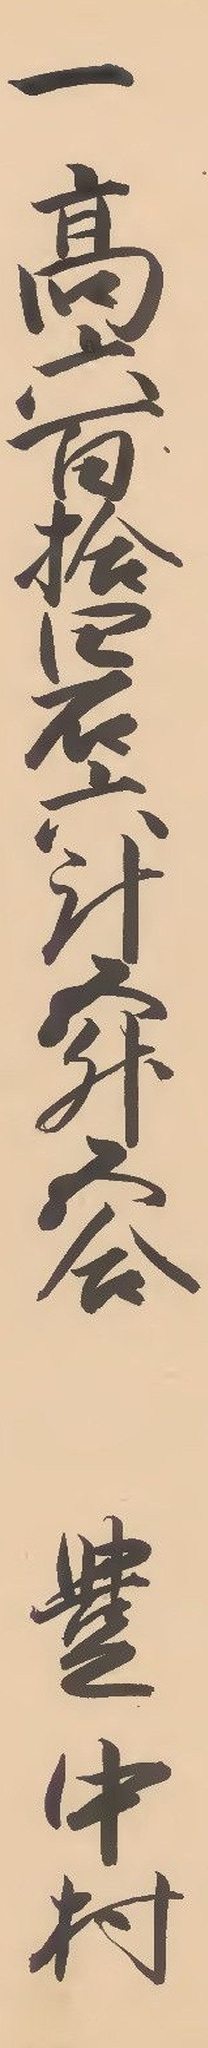一高六百拾四石六斗五升五合豊中村

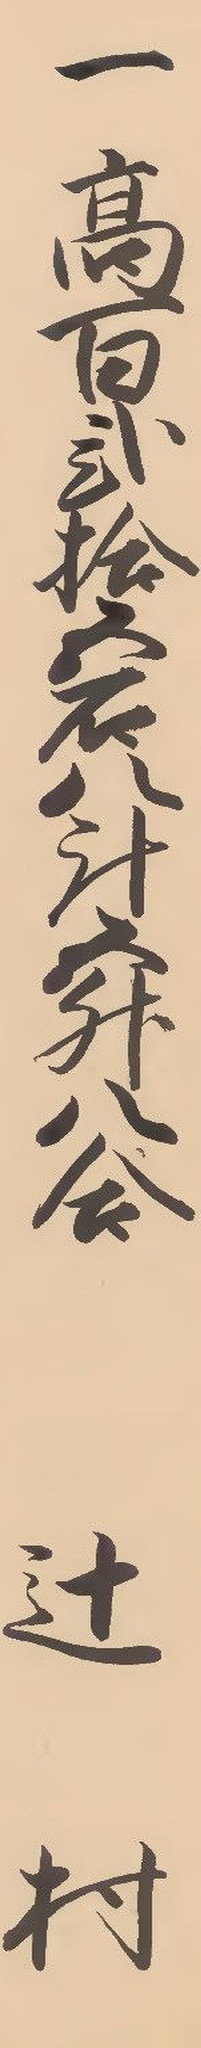一高百弐拾五石八斗五升八合辻村
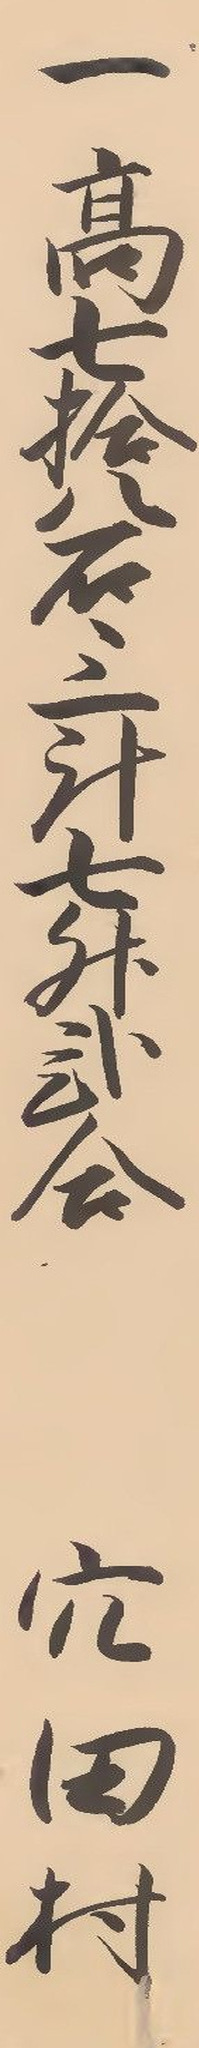一高七拾八石三斗七升弐合穴田村
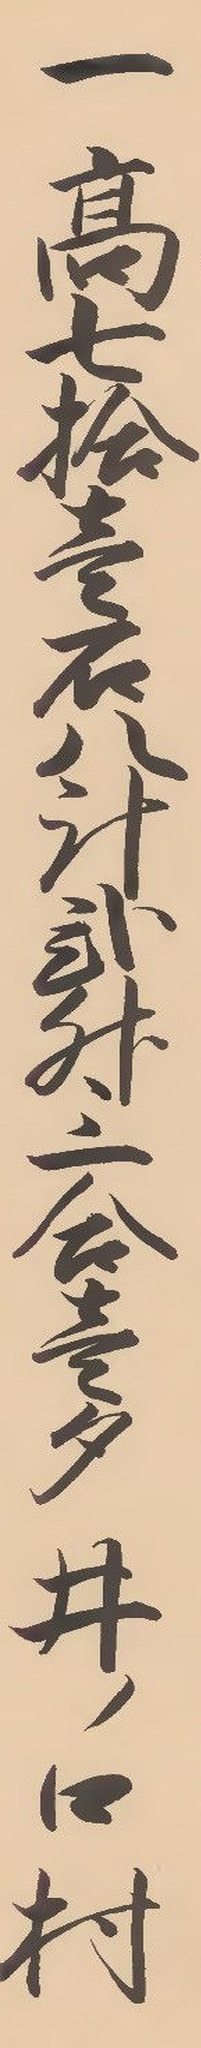一高七拾壱石八斗弐升三合壱勺井ノ口村
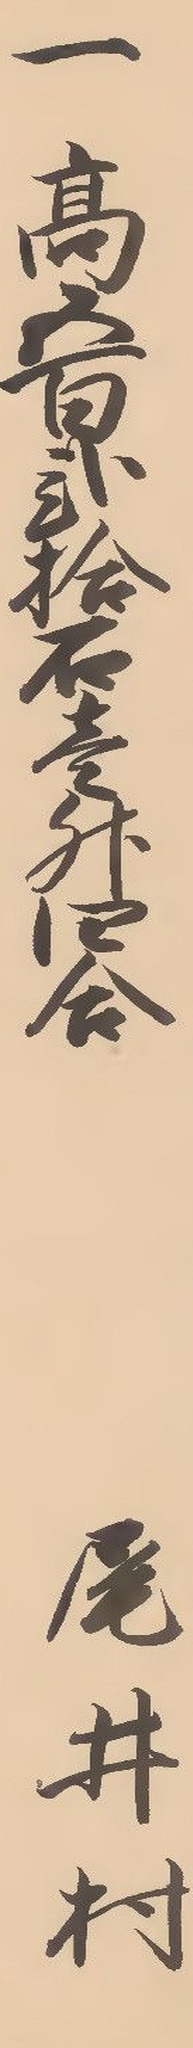一高五百弐拾石壱升四合尾井村
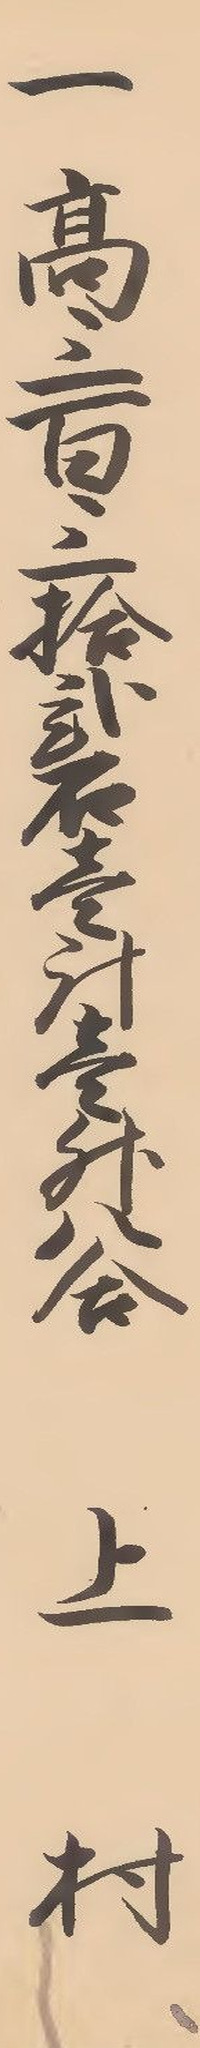一高三百三拾弐石壱斗壱升八合上村
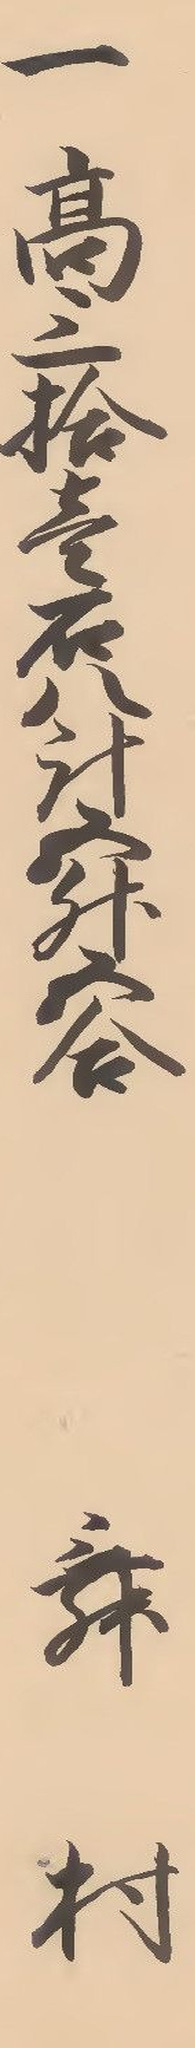一高三拾壱石八斗五升五合舞村
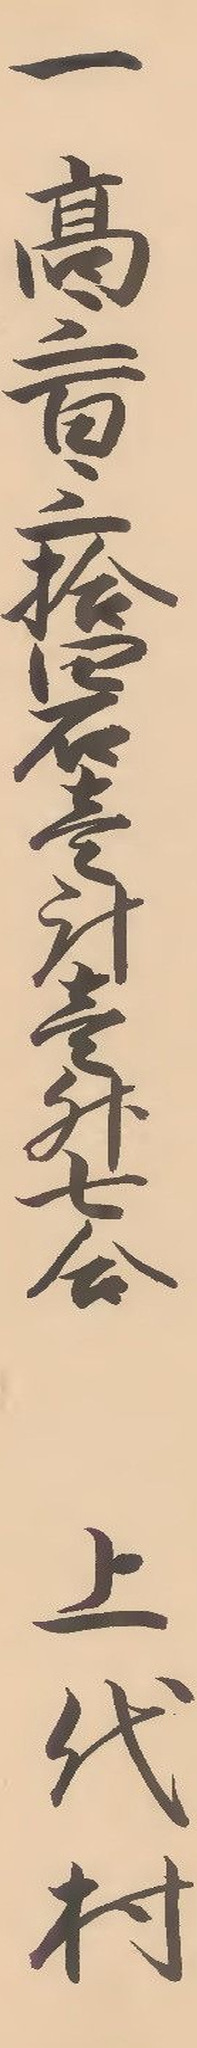一高三百三拾四石壱斗壱升七合上代村

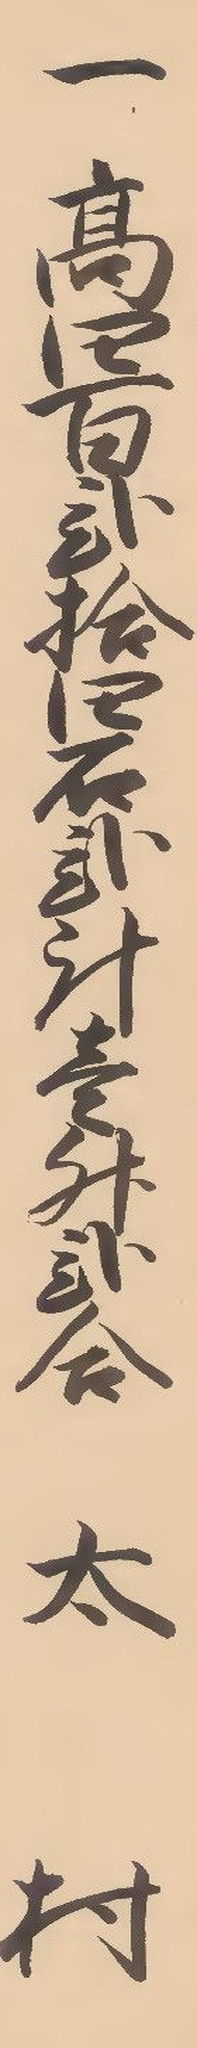一高四百弐拾四石弐斗壱升弐合太村
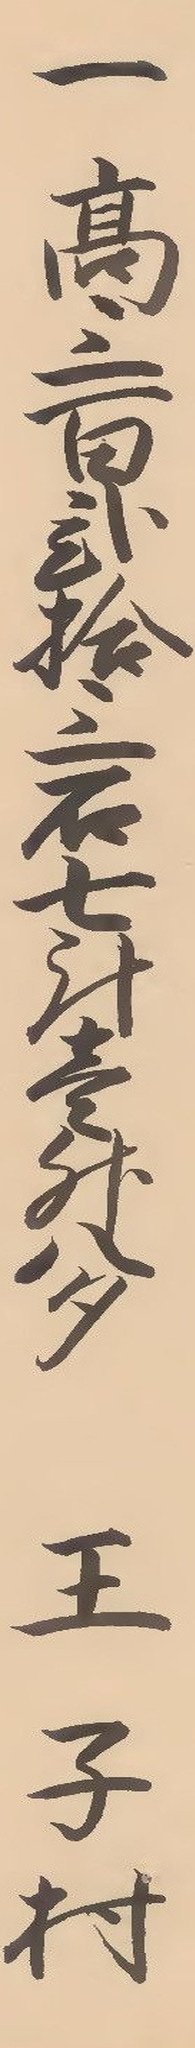一高三百弐拾三石七斗壱升八勺王子村
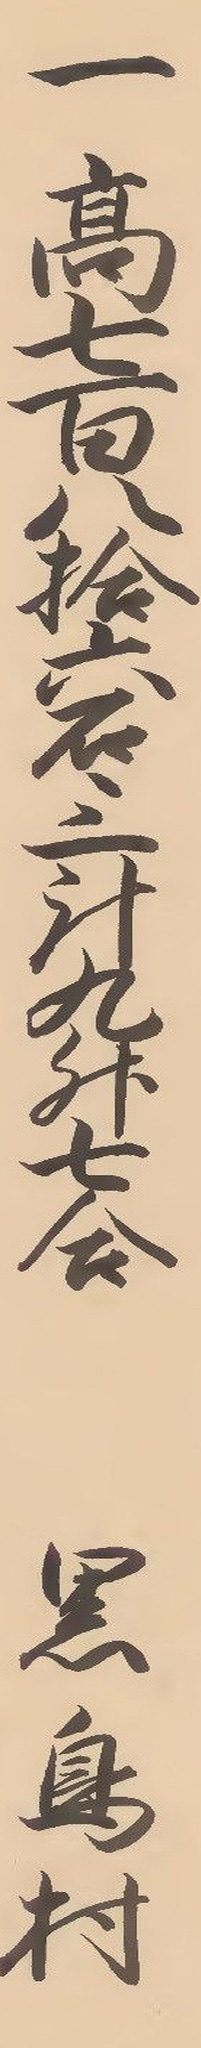一高七百八拾六石三斗九升七合黒鳥村
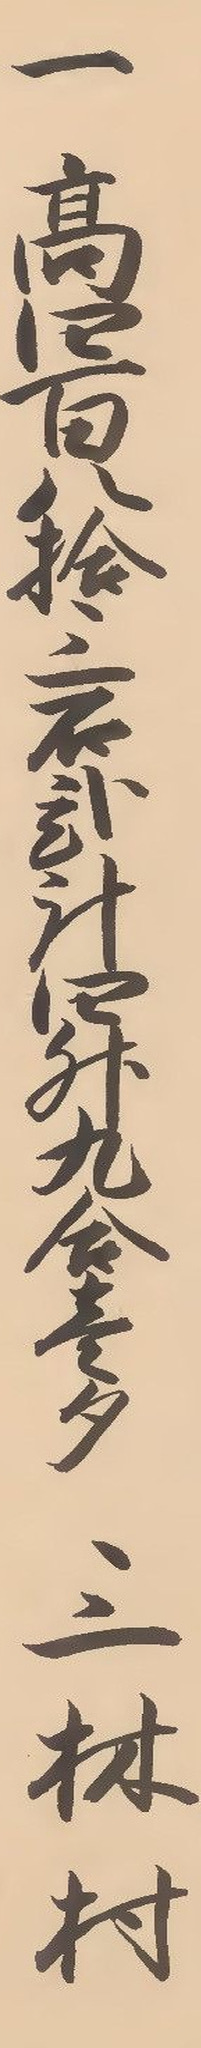一高四百八拾三石弐斗四升九合壱勺三林村
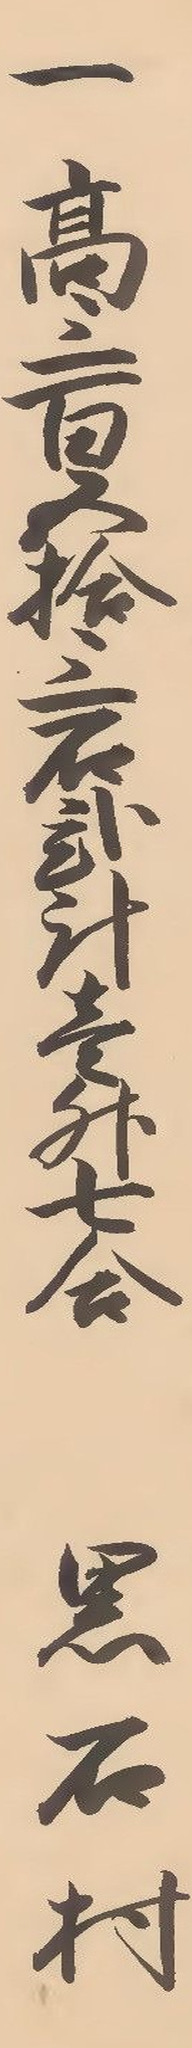一高三百五拾三石弐斗壱升七合黒石村
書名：和泉国郷帳
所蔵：国立公文書館 National Archives of Japan
